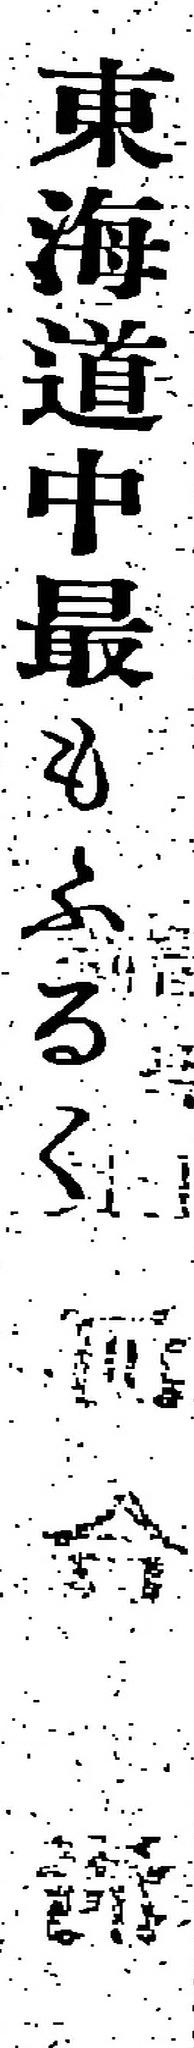東海道中最もふるく
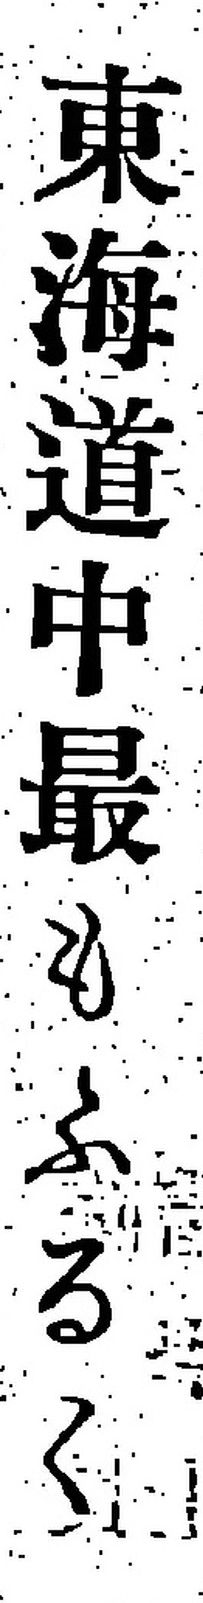東海道中最もふるく
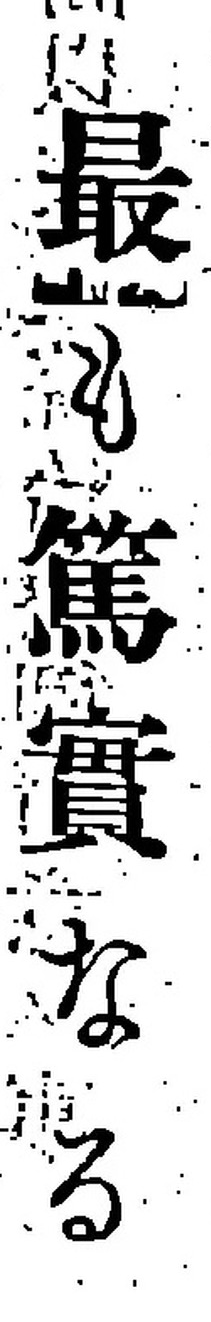最も篤実なる
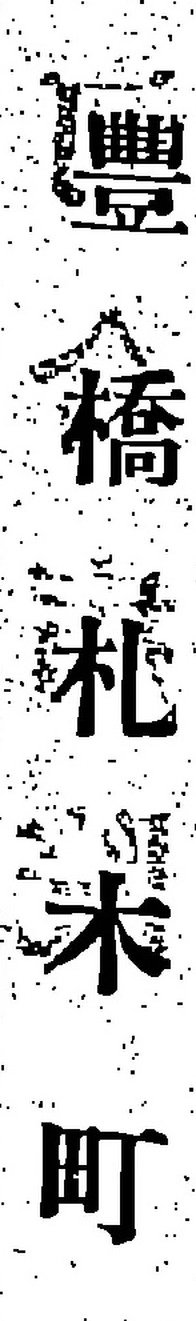豊橋札木町
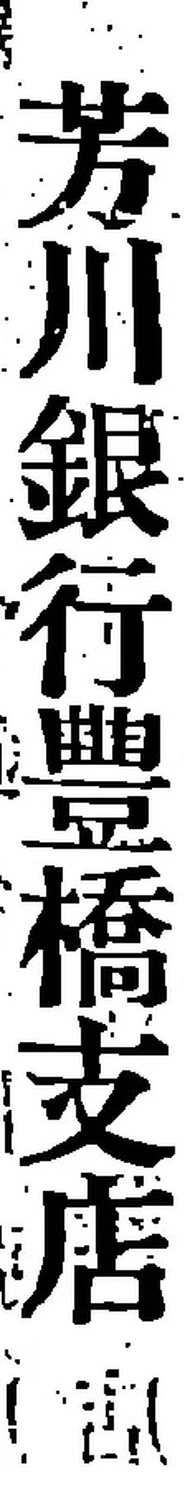芳川銀行豊橋支店

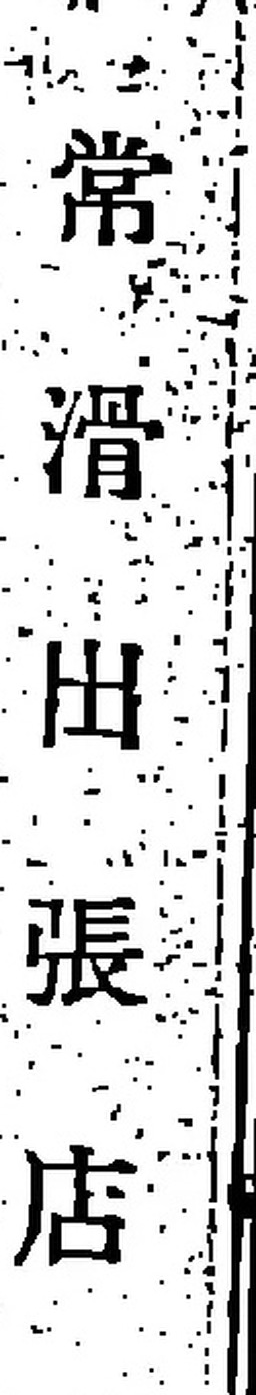常滑出張店
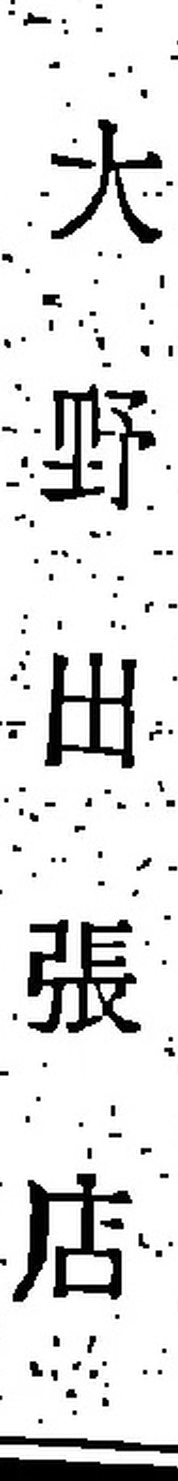大野出張店
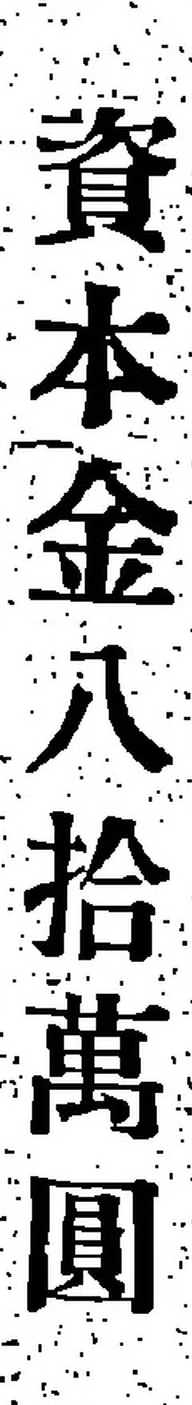資本金八拾万円
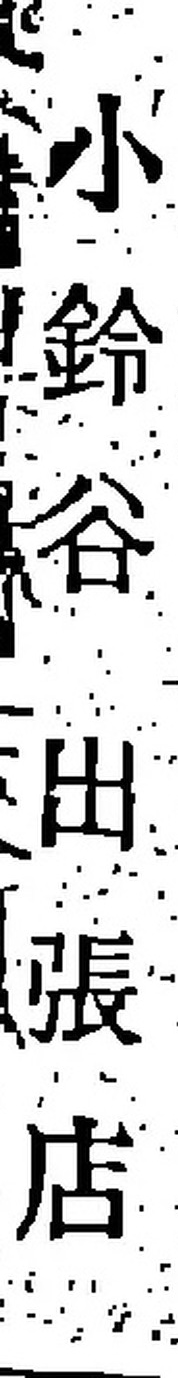小鈴谷出張店
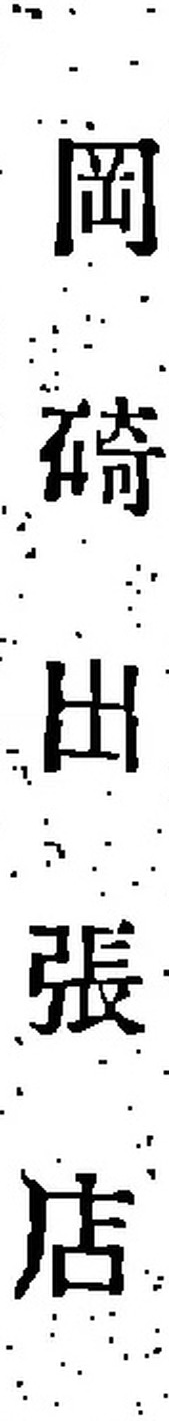岡碕出張店
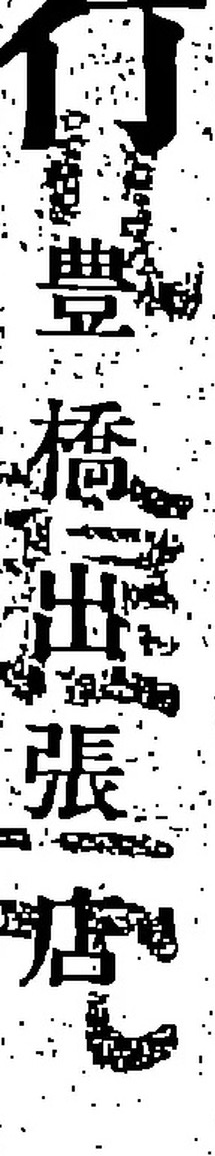豊橋出張店
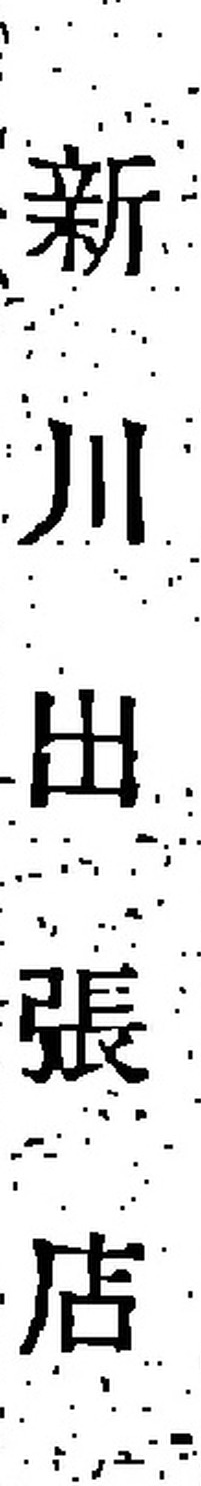新川出張店
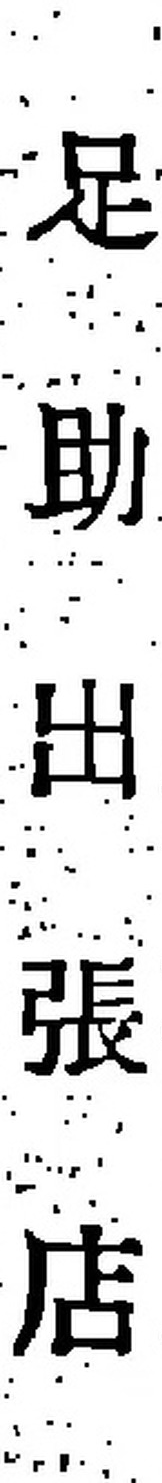足助出張店
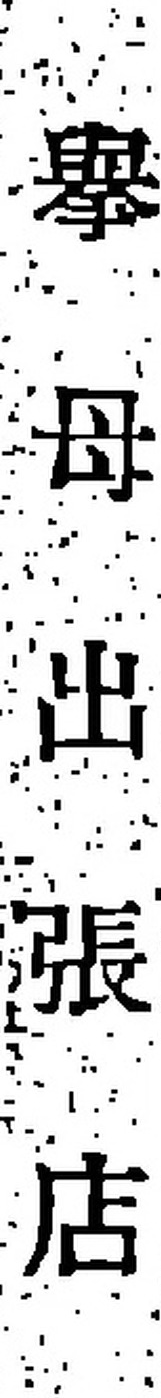挙母出張店
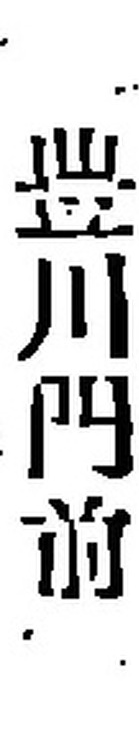豊川門前
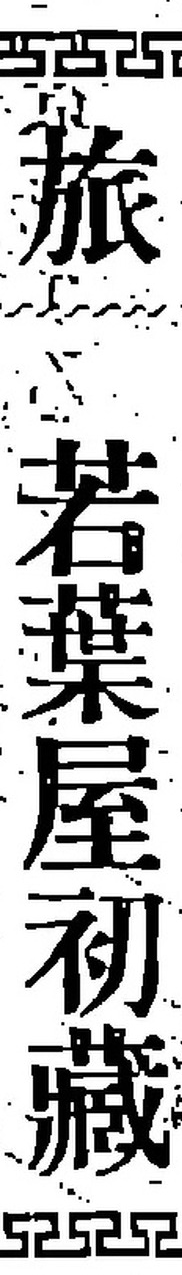若葉屋初蔵
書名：東参名勝案内
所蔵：国立国会図書館 National Diet Library, JAPAN
